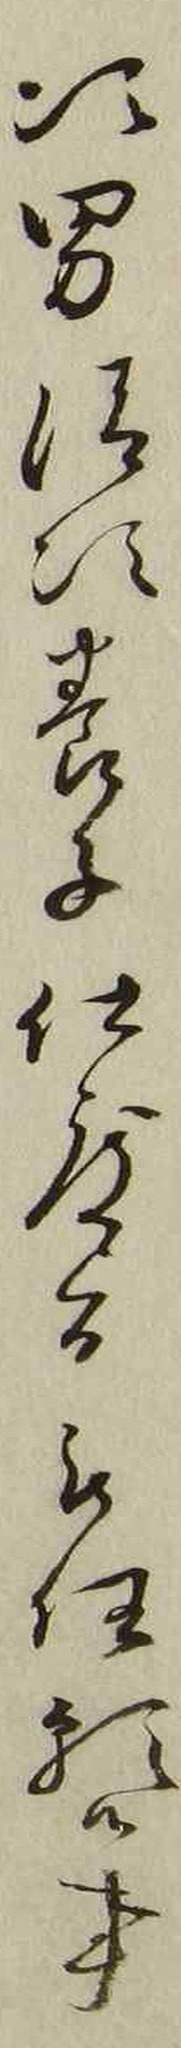次男清次養子仕度旨被任願候事
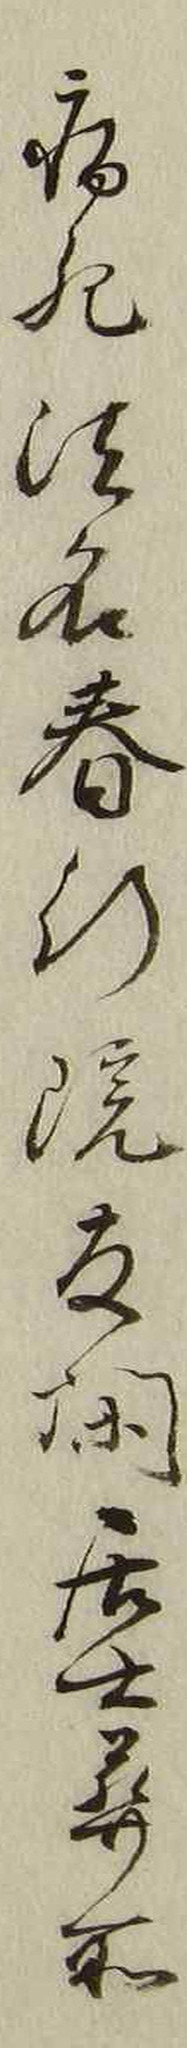病死法名春行院友閑居士葬所
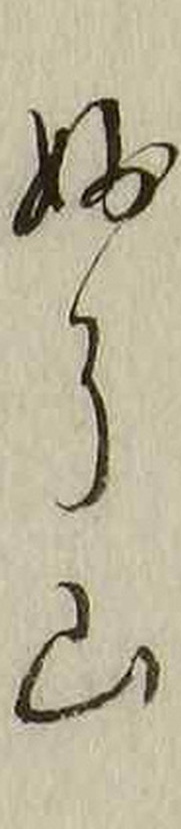妙了山
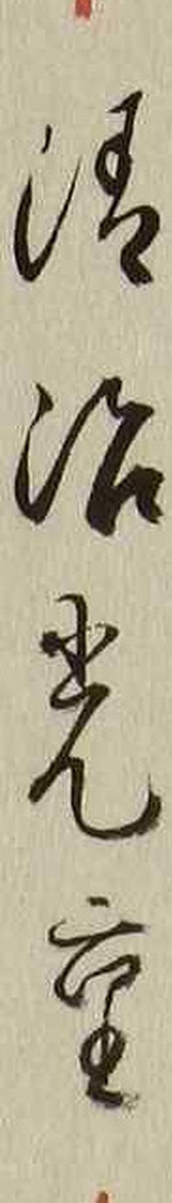清治光重
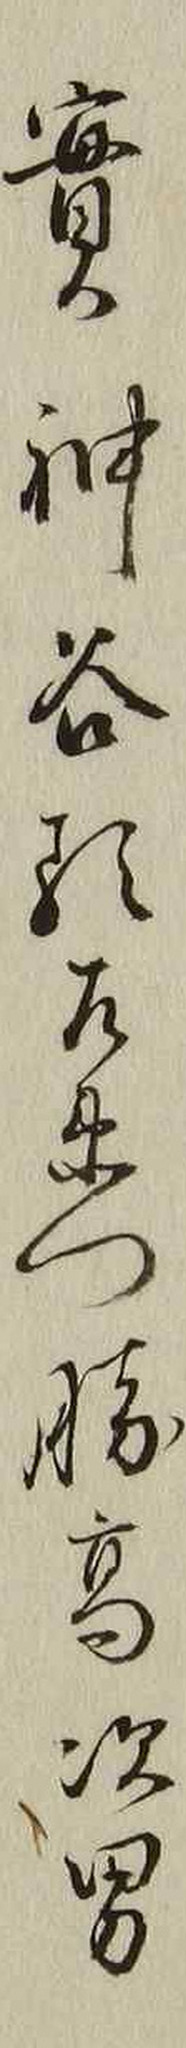実神谷類左衛門勝高次男
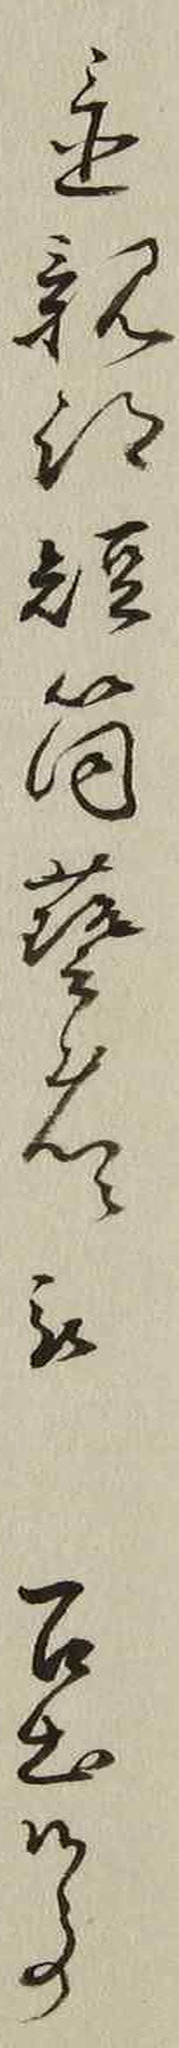置親跡短筒芸者被召出候事
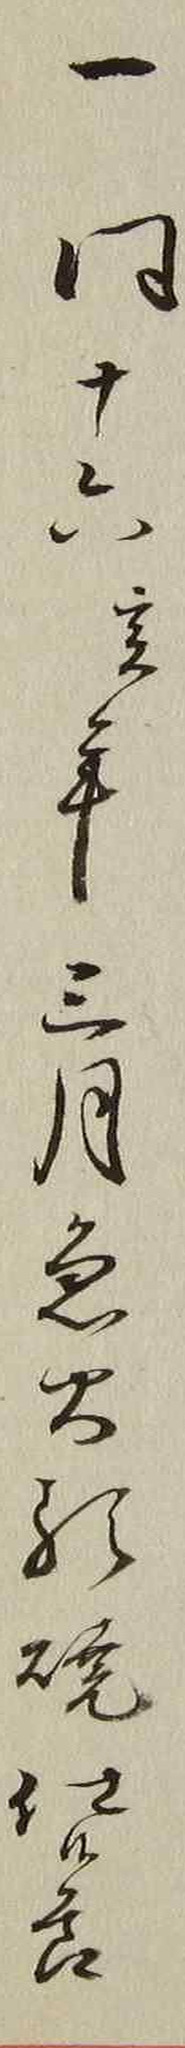一同十六亥年三月急火類焼仕候節
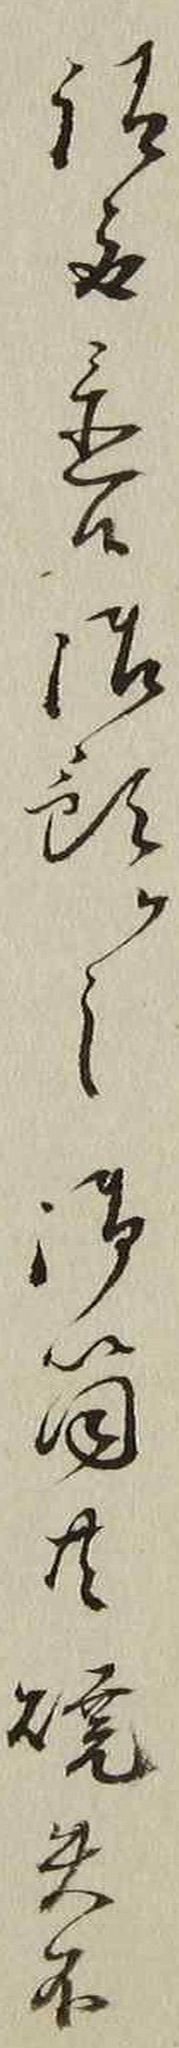請取置候御預ケ之御筒共焼失不
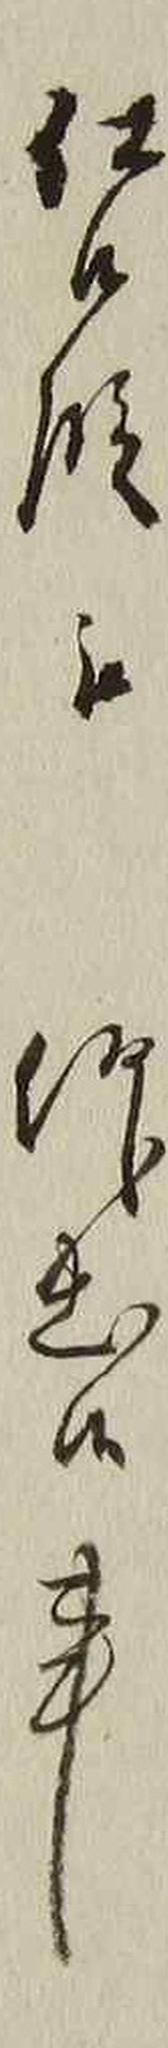仕候段被仰出候事
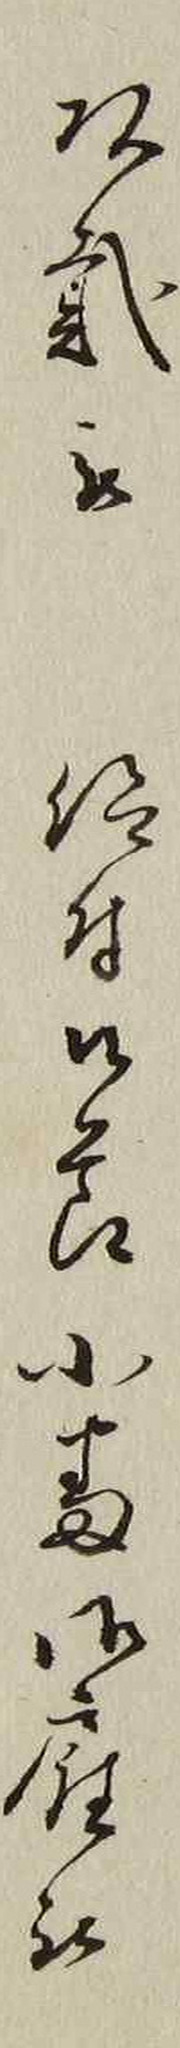頂戴被仰付候節小番御雇被
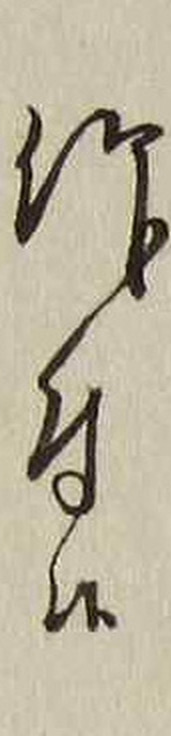仰付候
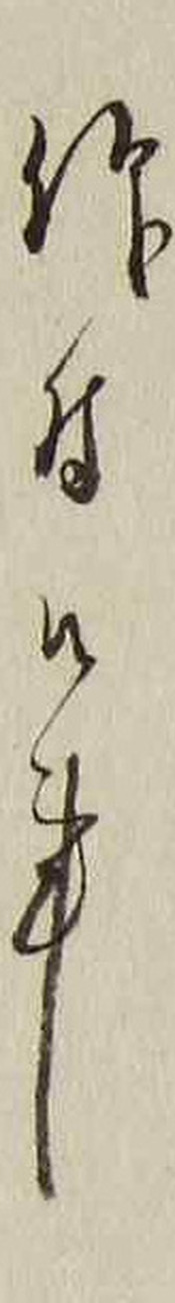仰付候事
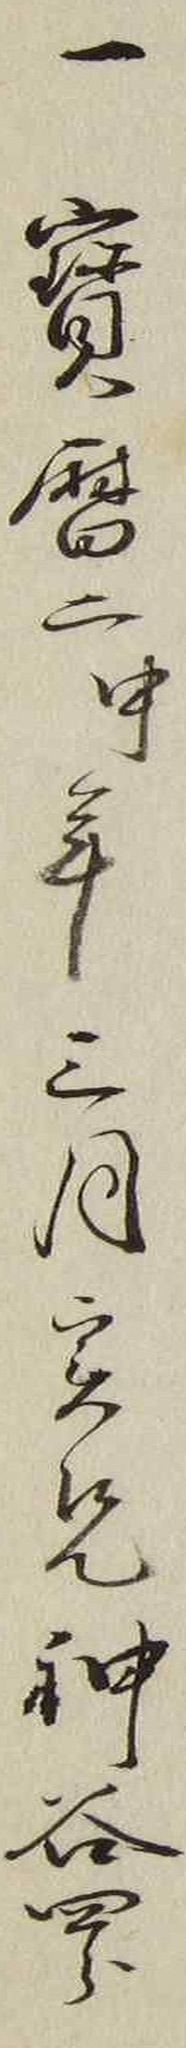宝暦二申年三月実兄神谷四郎

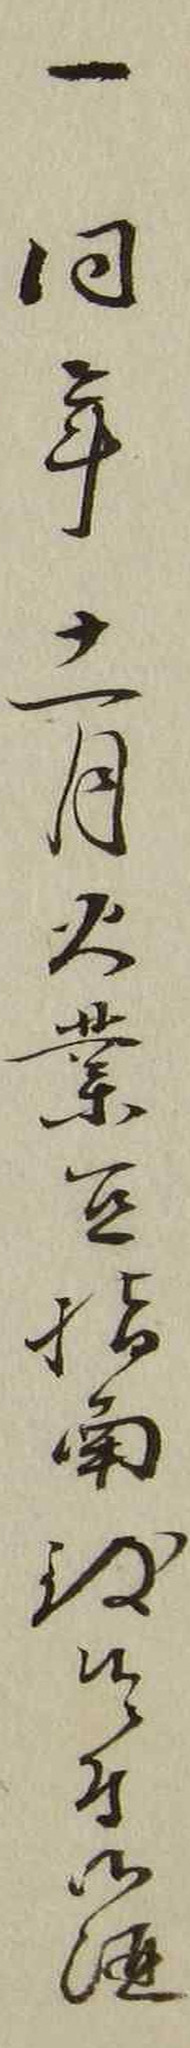一同年十一月火業宜指南致候付御酒
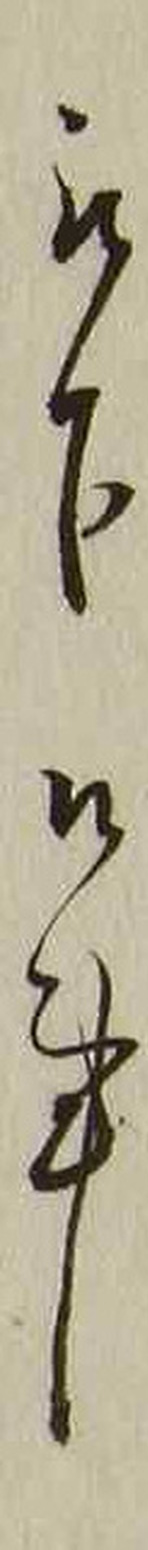被下候事
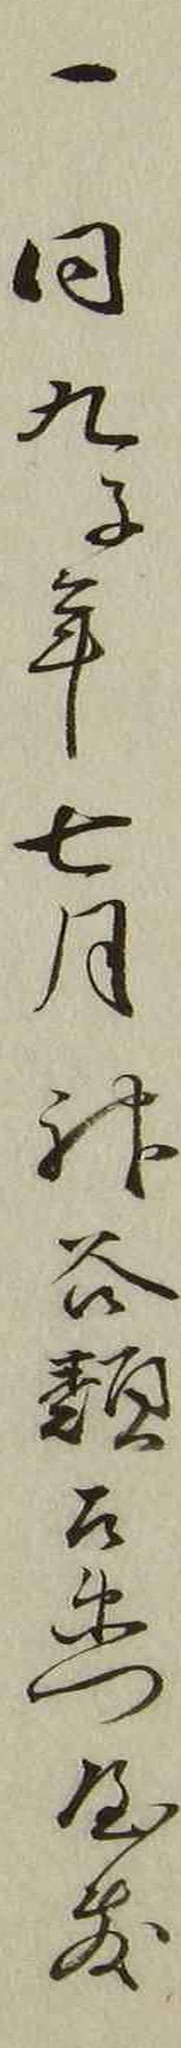一同九子年七月神谷類左衛門屋敷
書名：諸士系譜　巻之7　い之部7
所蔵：会津若松市立会津図書館
